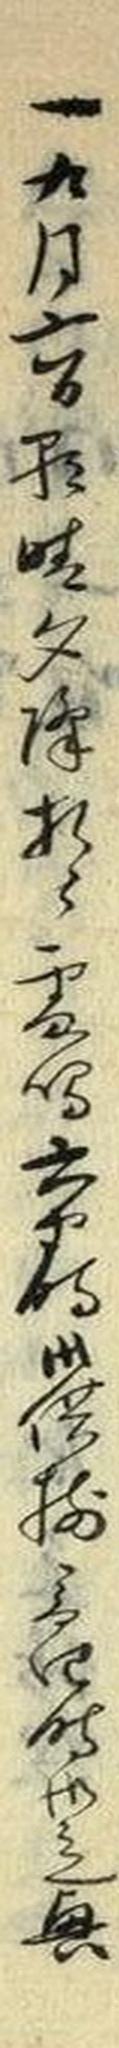一九月六日朝晴夕降折々雷鳴六半時御供揃ニ而四時御立興
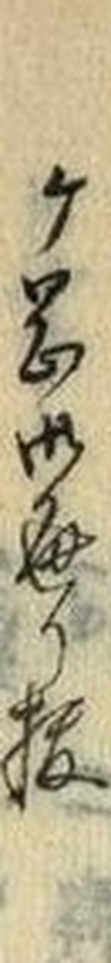ケ岡御通り抜
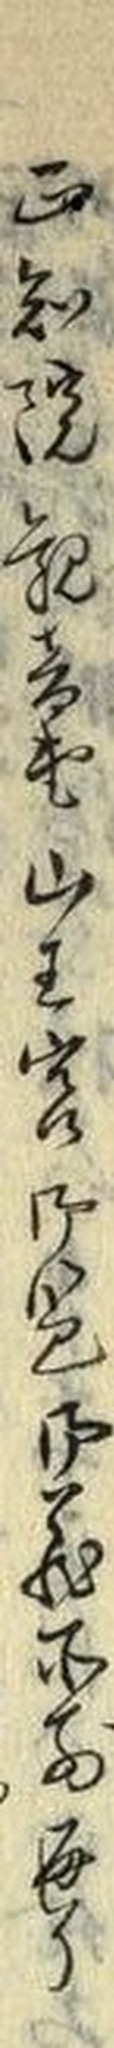正知院観音堂山王宮御覧御蔵所前通り
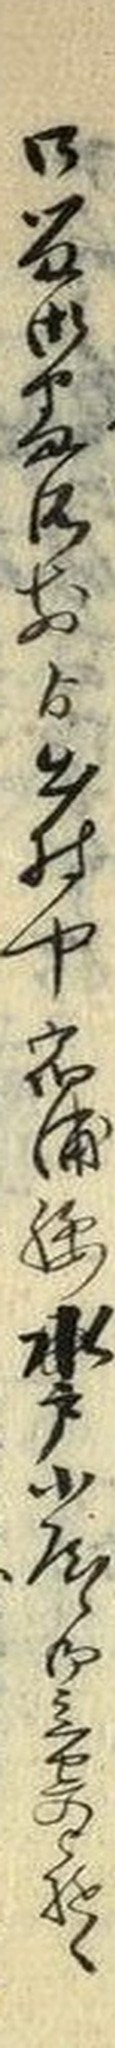御留御番所前ゟ出村中宿浦腰水戸小屋へ御立寄被遊候
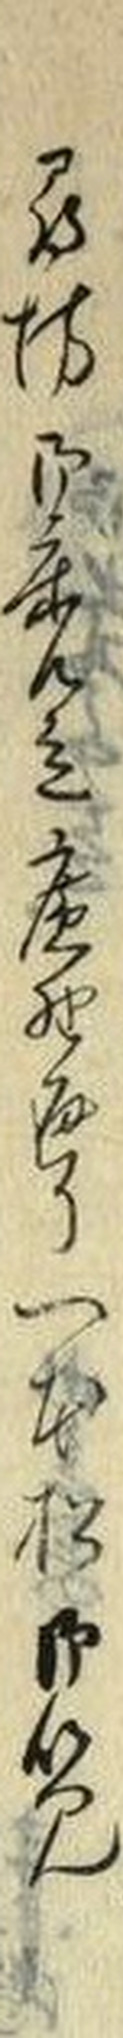尋坊御床几立広野通り一本松御覧

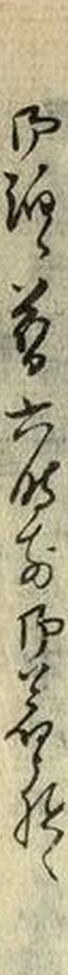御泊へ暮六時前御着被遊候
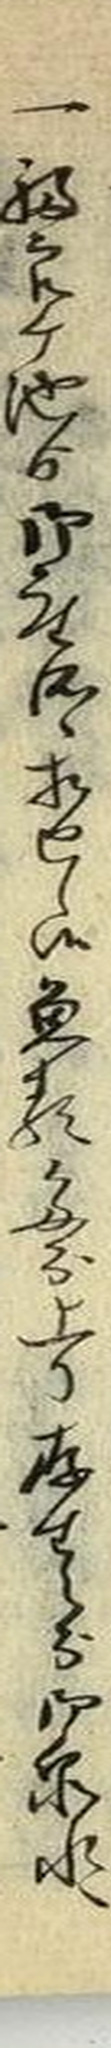一福良ケ池ゟ御座所へ相廻し候魚類多分上り存生之分御泉水へ
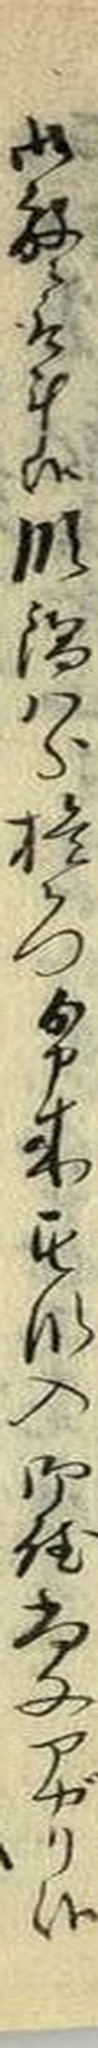御放ニ取計候段鍋八郎権右衛門ゟ申来其段入御聴尚又アガリ候
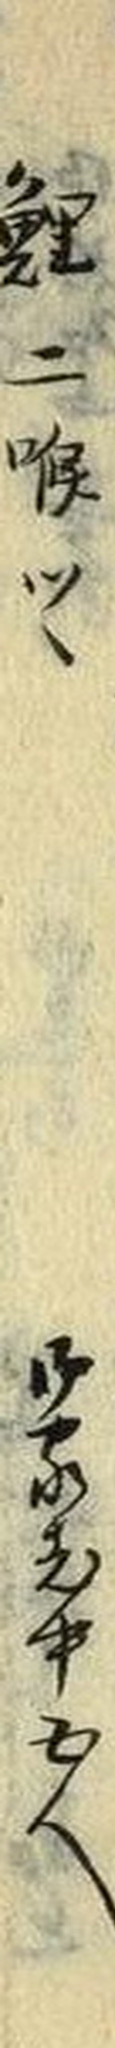鯉二喉ツヽ御家老中五人
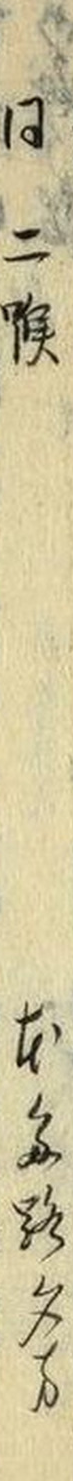同二喉本多路夕方
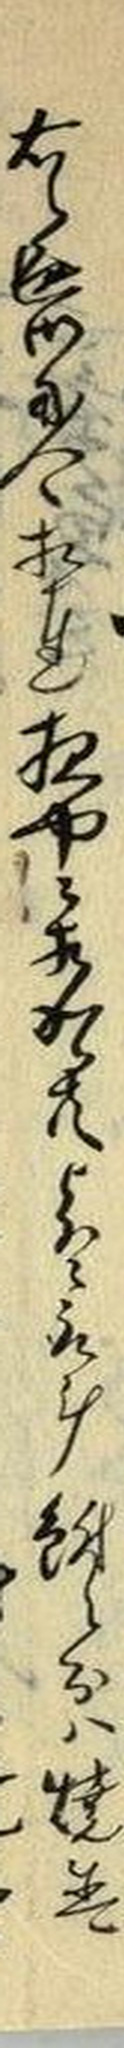右之通御用人へ相達夜中ニ相成候共被下ニ取計鮒之分ハ焼直候
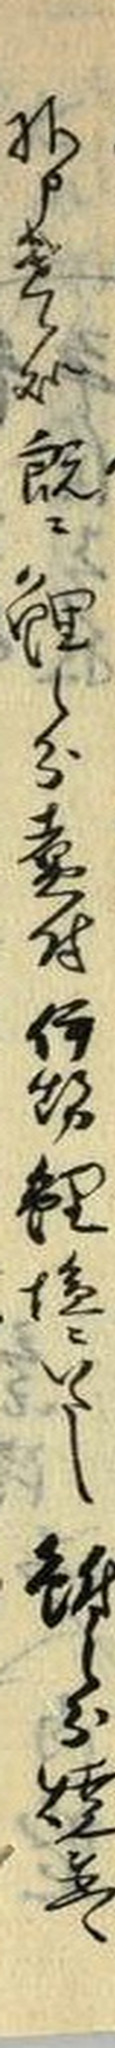様申遣候処既ニ鯉之分煮付伊勢鯉塩ニいたし鮒之分焼直候
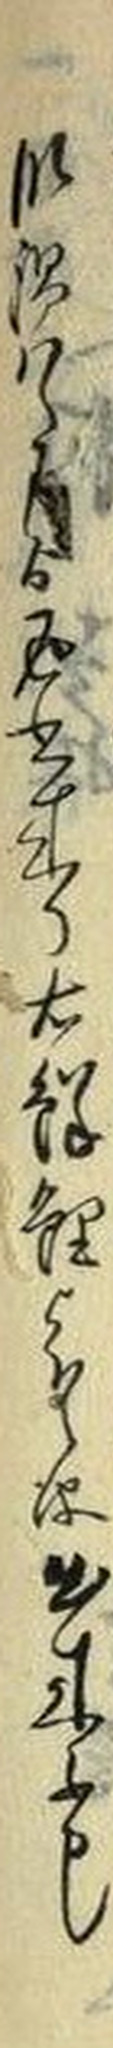段鍋八郎ゟ返書来り右鮮鯉被下之儀出来不申候
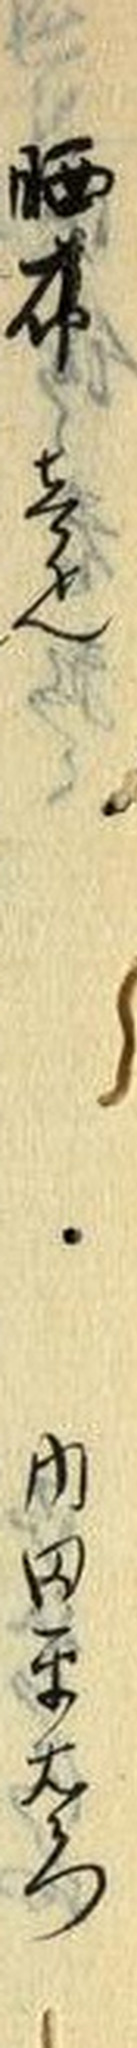晒布壱疋内田平右衛門
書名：少傅日録抄（斉承付側向頭取日記、在国）
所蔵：福井県文書館 Fukui Prefectural Archives
